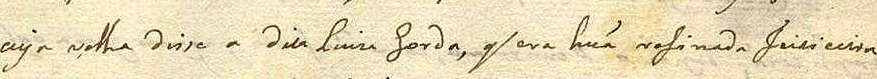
cuja velha disse a dita Luiza Gorda, q̄ era huā refinada feiticeira,
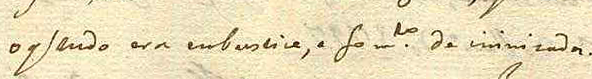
o q̄ sendo era enbustice, e som.te de inimizade.
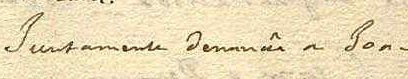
Iuntamente denuncia a Ioa
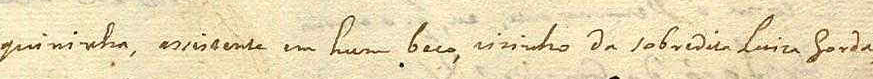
quininha, assistente em hum beco, vizinho da sobredita Luiza Gorda,
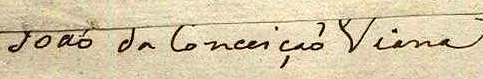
Ioaõ da Conceiçaõ Viana
